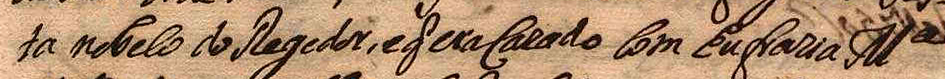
ta no beCo do Regedor, e q̄ era Cazado com Eufrazia Ma
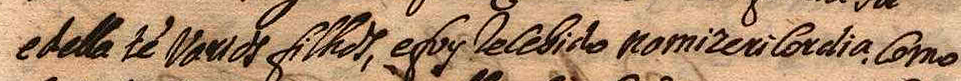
e della tē varios filhos, e foy Recebido na mizeriCordia. Como
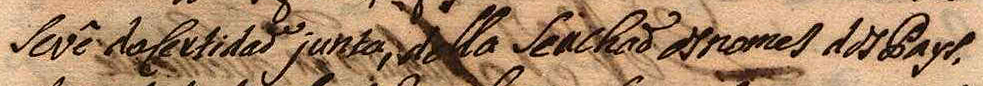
se vê da Certidaõ junta, della se achaõ os nomes dos Pays.
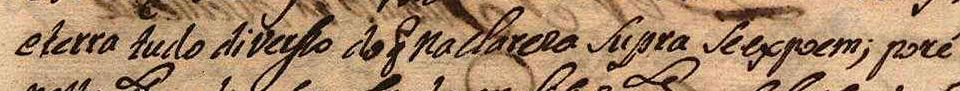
e terra tudo diversso do q̄ na clareza Supra se expoem; porē
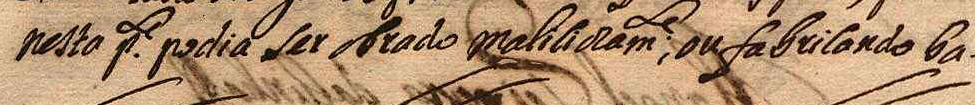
nesta p.te podia ser obrado maliCiozamte; ou fabriCando ba
